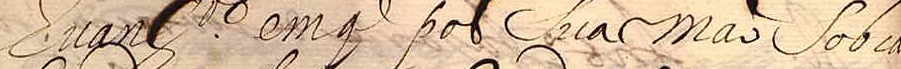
Euang.os em q̄ pos sua maõ sob ca
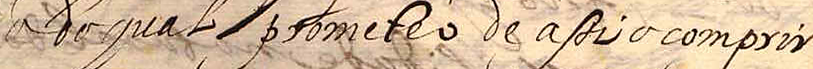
go do quaL prometeo de assi o comprir
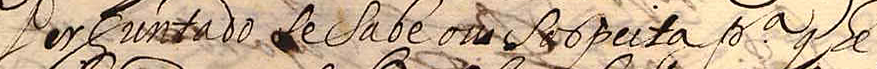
Perguntado se sabe ou sospeita p.a q̄ he
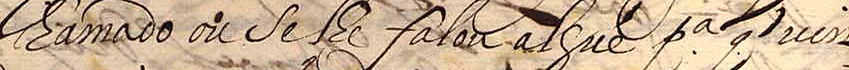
chamado ou se lhe falou alguē p.a q̄ uin
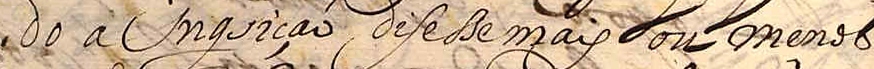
do a Inꝗsiçaõ disesse mais ou menos
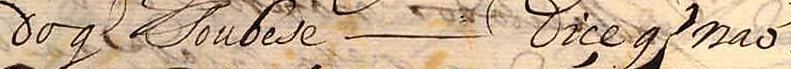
do q̄ soubese – Diçe q̄ naõ
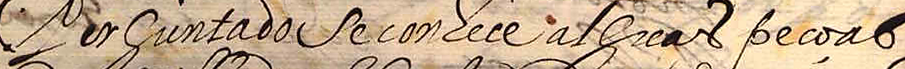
Perguntado se conhece alguas peçoas
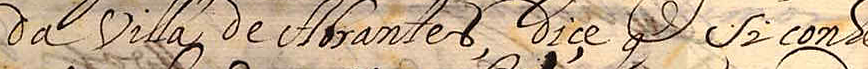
da Villa de Abrantes, dice q̄ si conhe
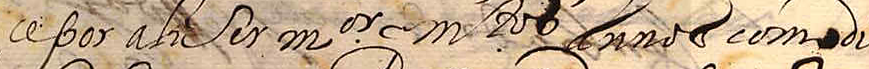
ce por ali ser m.or m.tos annos como di
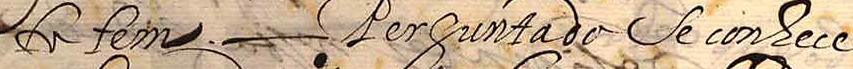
to tem. – Perguntado se conhece
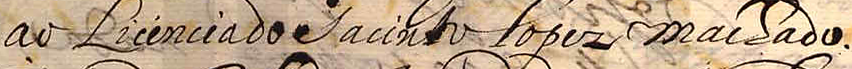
ao Licenciado Iacinto Lopez machado
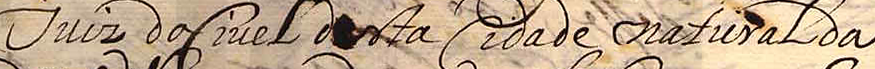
Iuiz do CiueL desta Cidade naturaL da
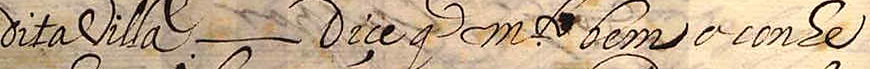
dita Villa – Diçe q̄ m.to bem o conhe
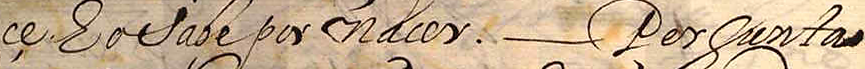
ce E o sabe por nacer. – Pergunta
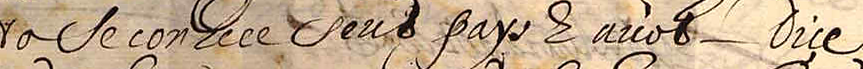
do se conhece seus pays E auós – Dice
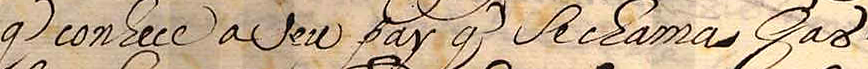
q̄ conhece a seu pay q̄ se chama Gas
